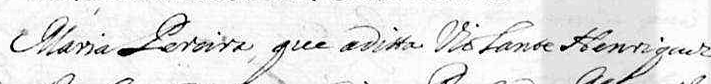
Maria Pereira que a ditta Violante Henriquez
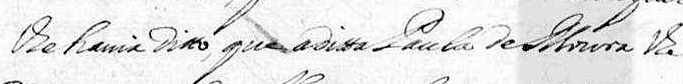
lhe hauia ditto que a ditta Paula de Moura lhe
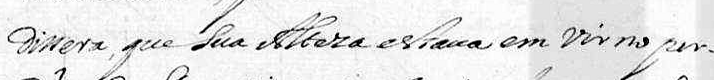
dissera que sua Alteza estaua em vir no per
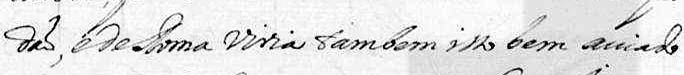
daõ, e de Roma viria tambem isto bem auiado
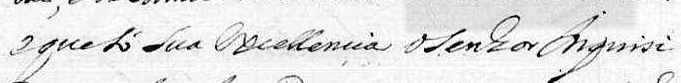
e que só Sua Excellencia o senhor Inquisi
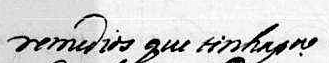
remedios que tinha pr.o
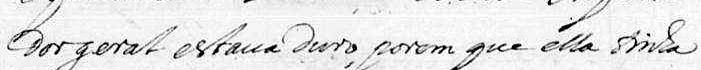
dor geral estaua duro, porem que ella tinha
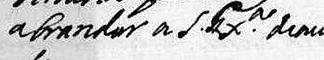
abrandar a S. Ex.a de au
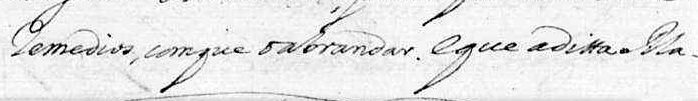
Remedios, com que o abrandar. e que a ditta Ma
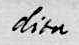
ditu
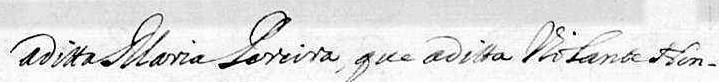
a ditta Maria Pereira, que a ditta Violante Hen
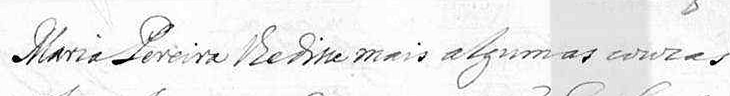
Maria Pereira lhe disse mais algumas couzas
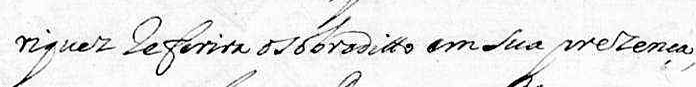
riquez Referira o sobreditto em sua prezença,
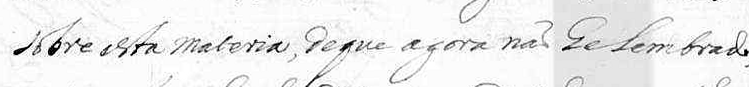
sobre esta materia, de que agora naõ he lembrado
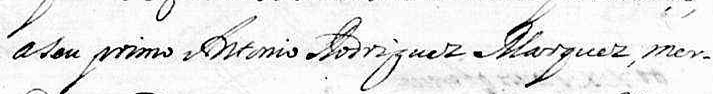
a seu primo Antonio Rodriguez Marquez, mer
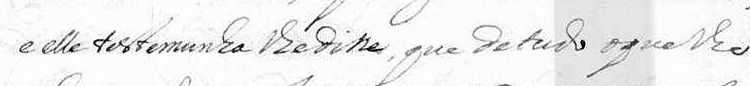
e elle testemunha lhe disse, que de tudo o que lhe
